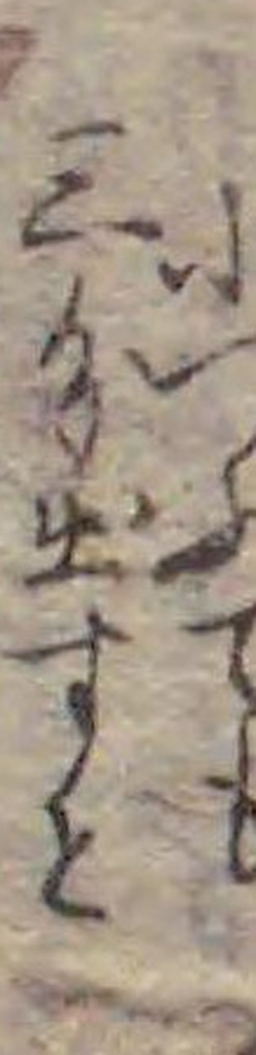三分出すと
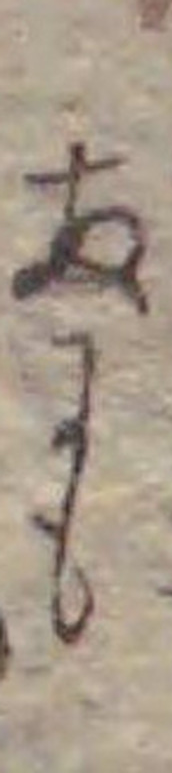両にも
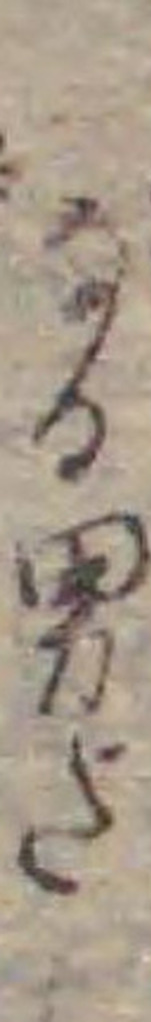なる男だ
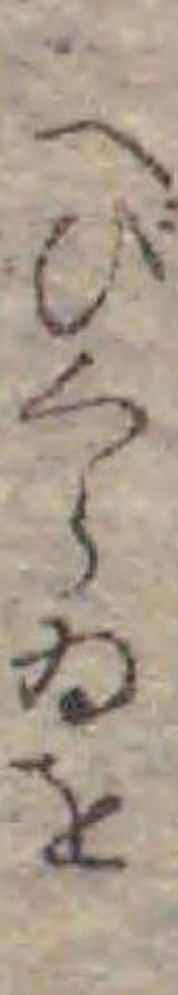へびくらゐを
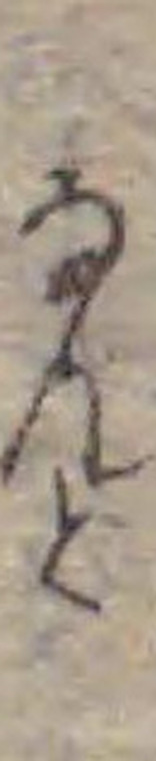なんと
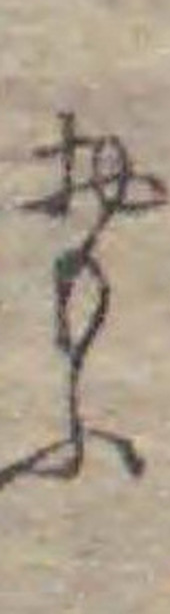おもふ
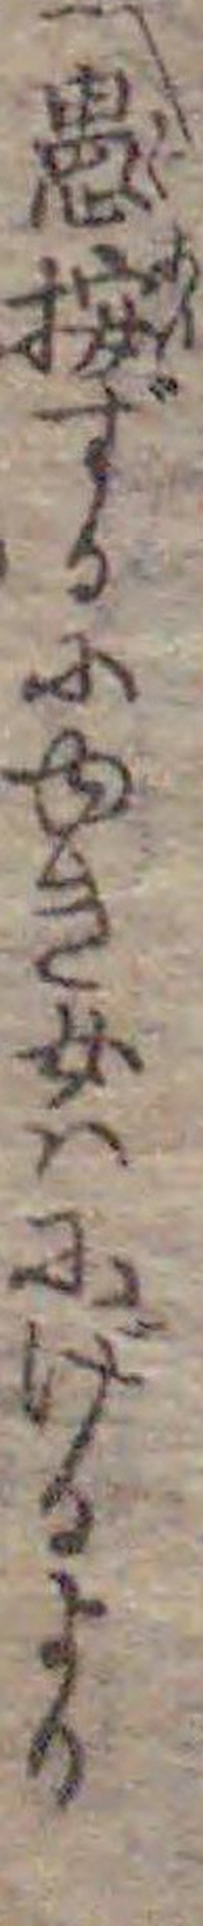〽愚按ずるにゆき女はにげるより
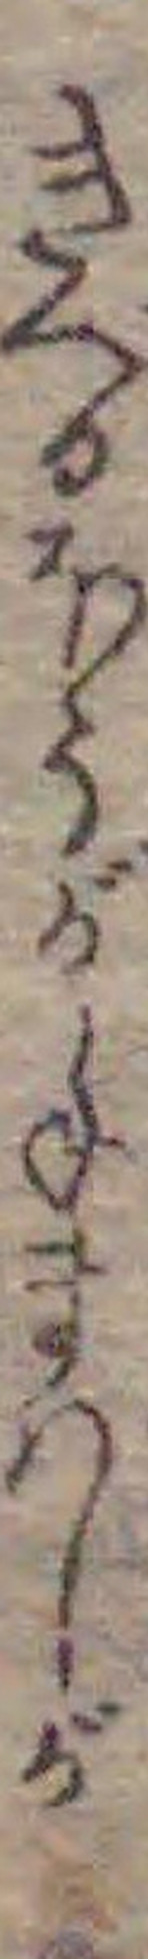きへるほうが手まはしが
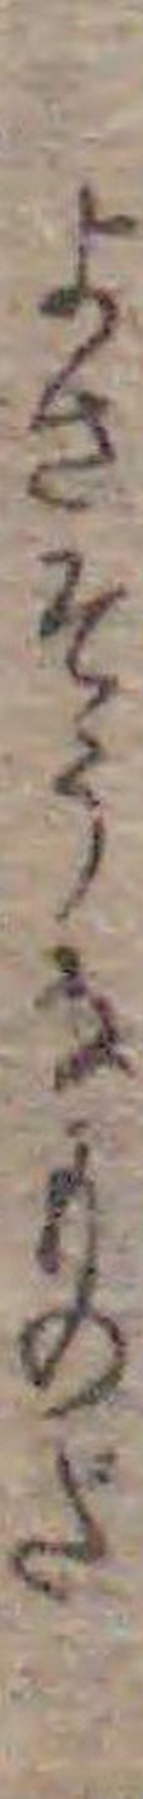よさそうなものだ

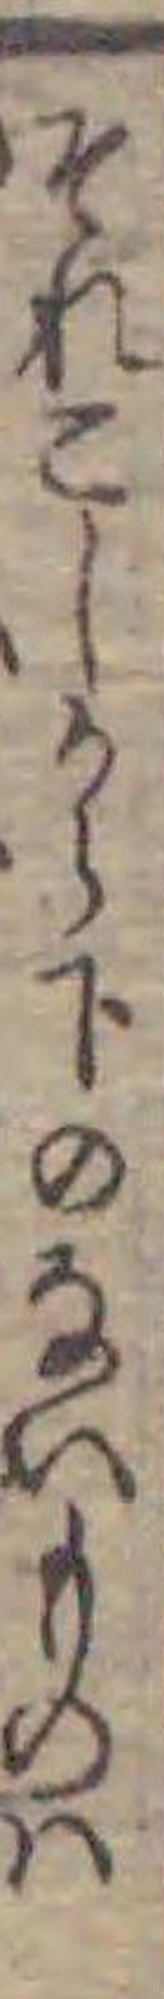それこしから下のないものは
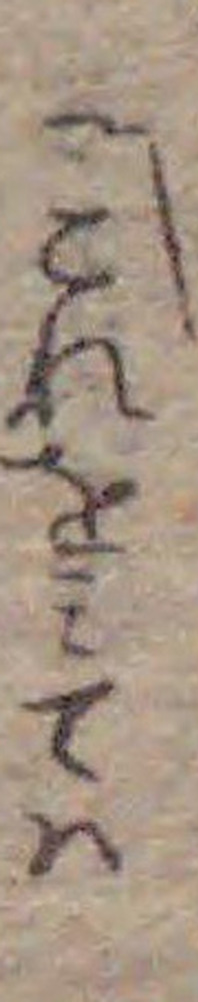〽これをみては
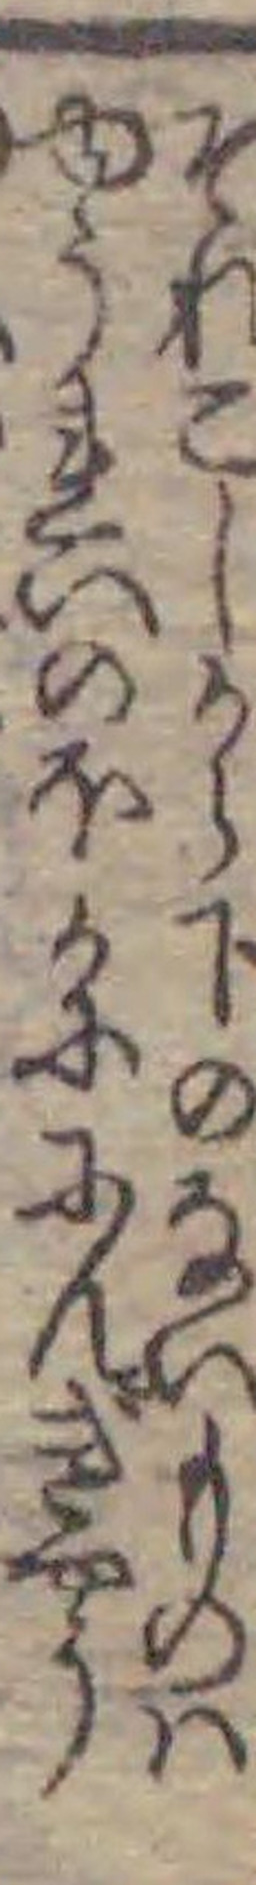ゆうれいのほかににんぎやう
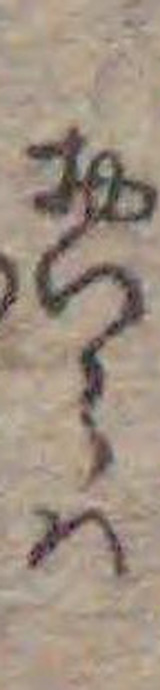おいらは
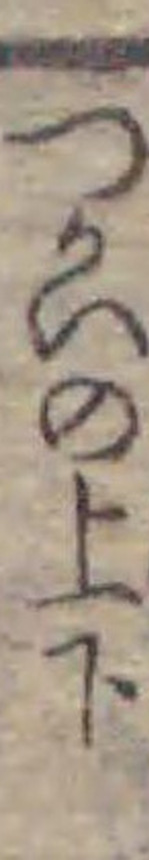つかいの上下
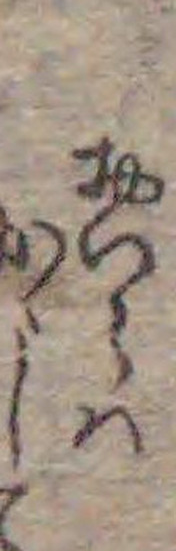おいらは
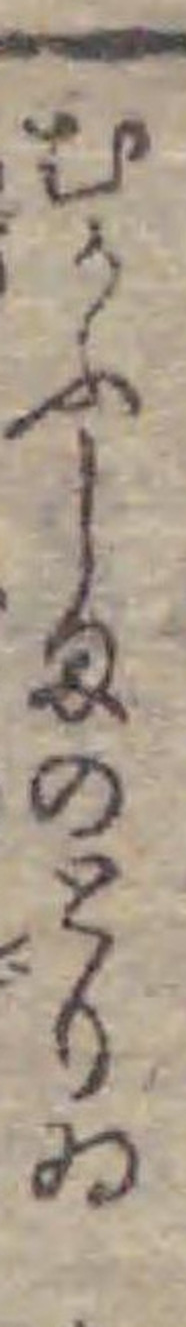むかうしまのとりゐ
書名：怪物つれつれ草 : 2巻
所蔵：国立国会図書館 National Diet Library, JAPAN
